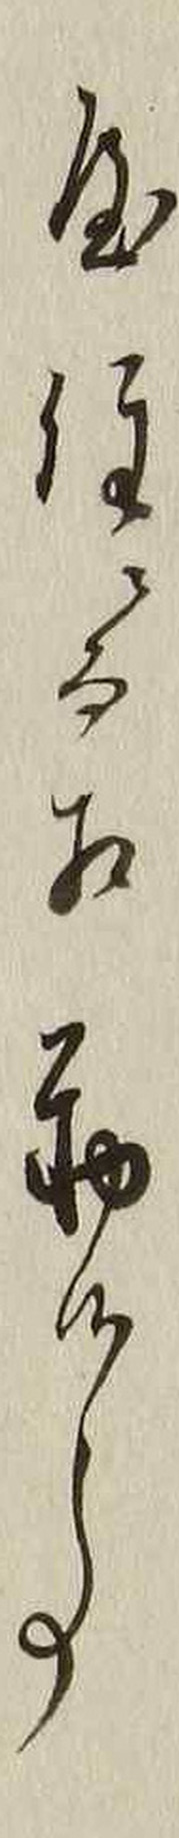屋住に而相勤候事
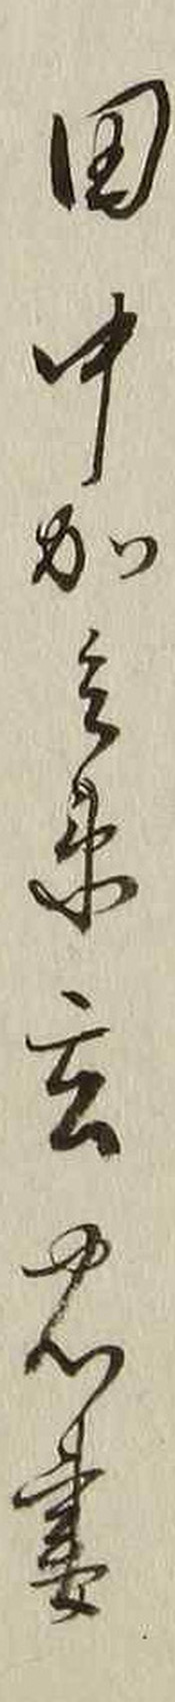女田中加兵衛玄忠妻
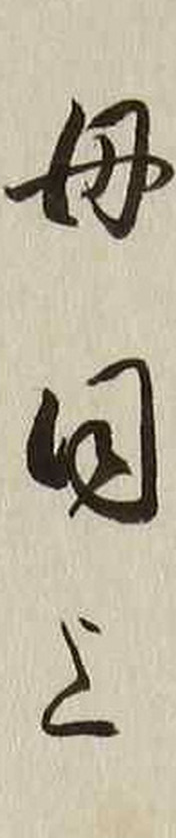母同上
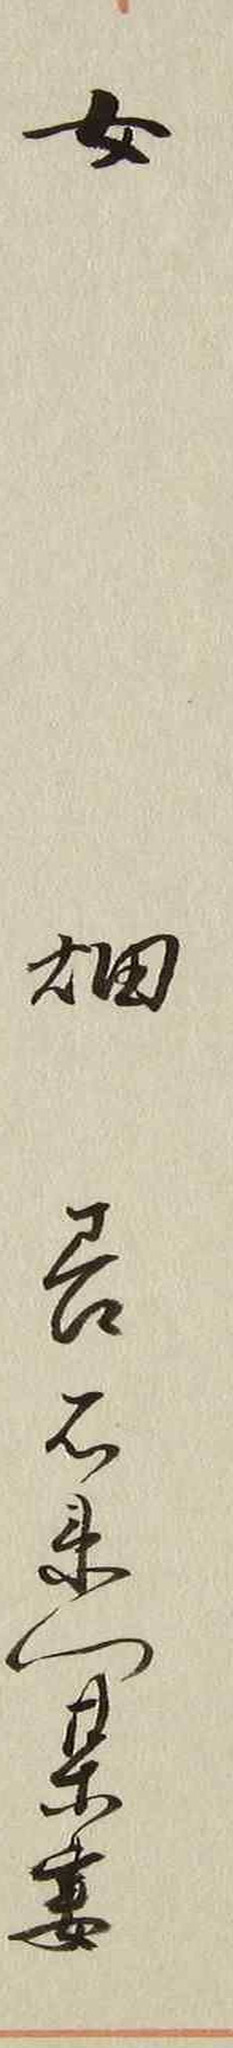女畑善右衛門某妻
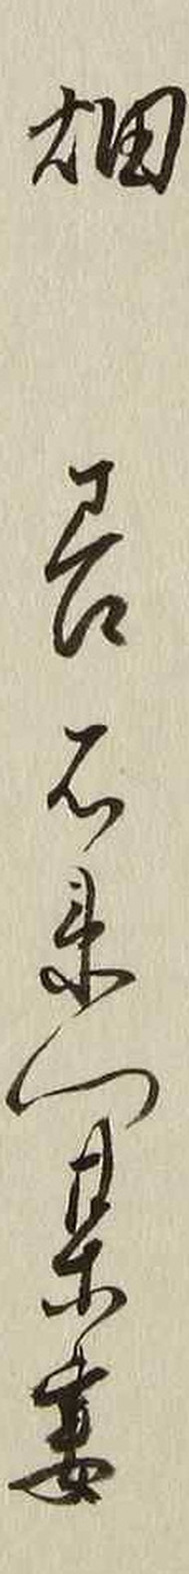女畑善右衛門某妻
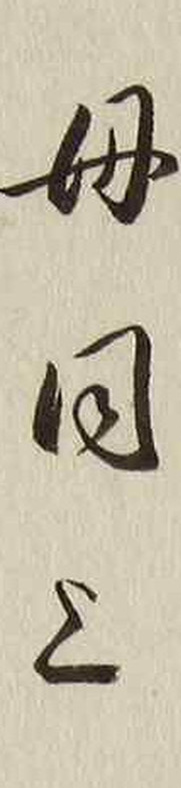母同上
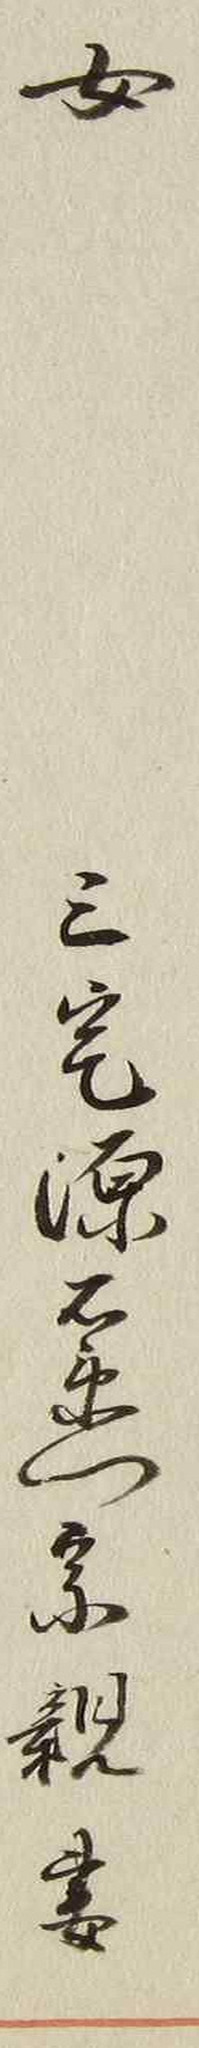女三宅源右衛門宗親妻
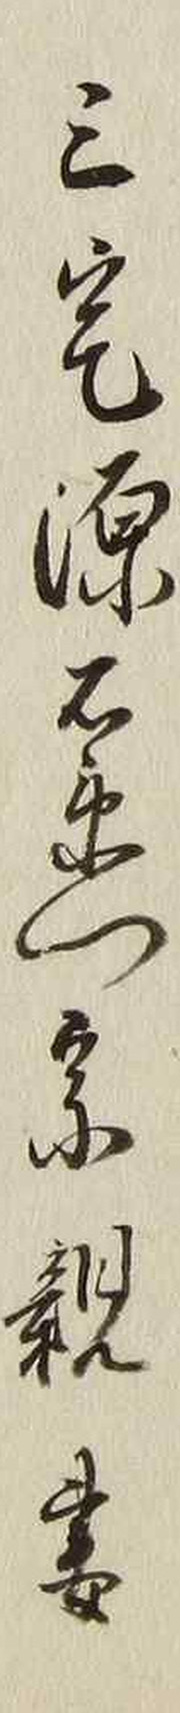女三宅源右衛門宗親妻
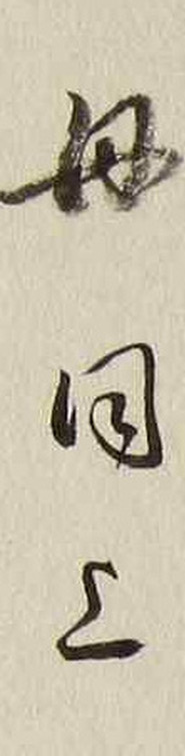母同上
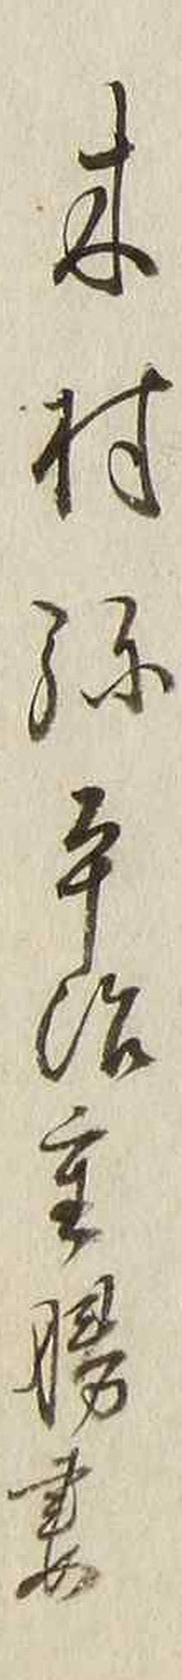女木村弥平治重膳妻

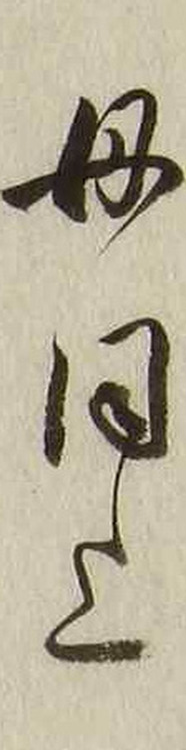母同上
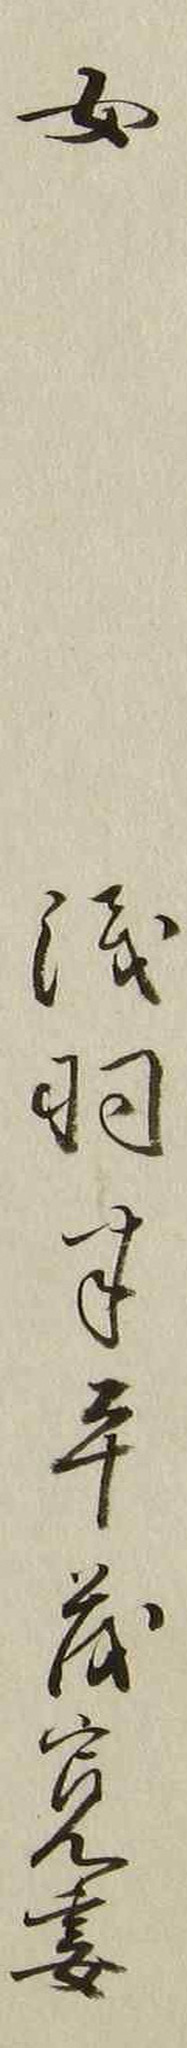女浅羽半平茂寛妻
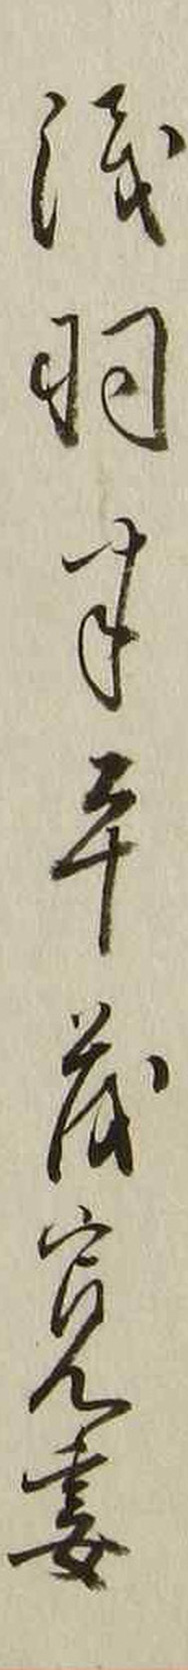女浅羽半平茂寛妻
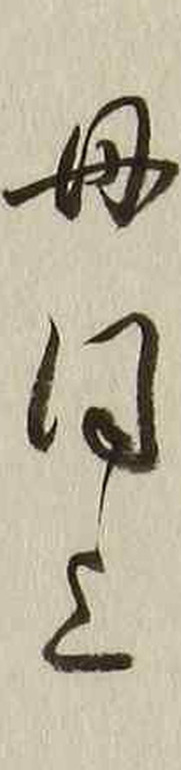母同上
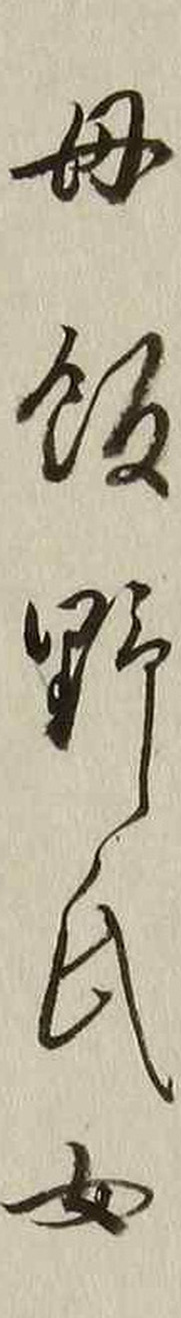母飯野氏女
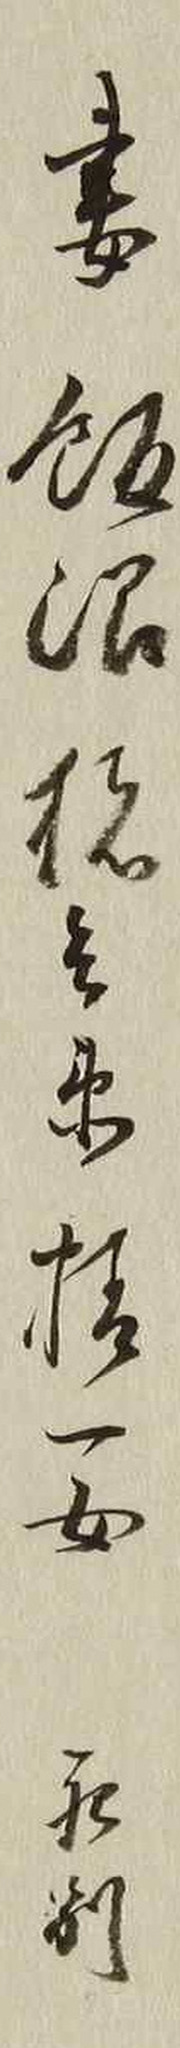妻飯沼猪兵衛精一女死別
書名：諸士系譜　巻之159　な之部1
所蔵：会津若松市立会津図書館
